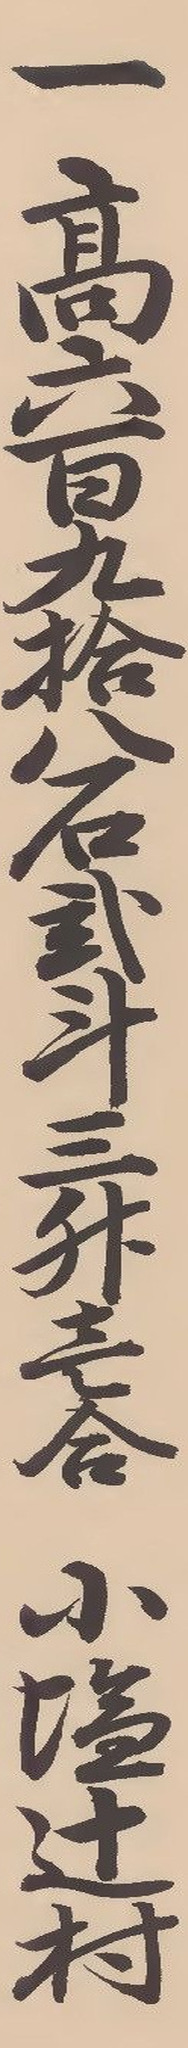一高六百九拾八石弐斗三升壱合小塩辻村
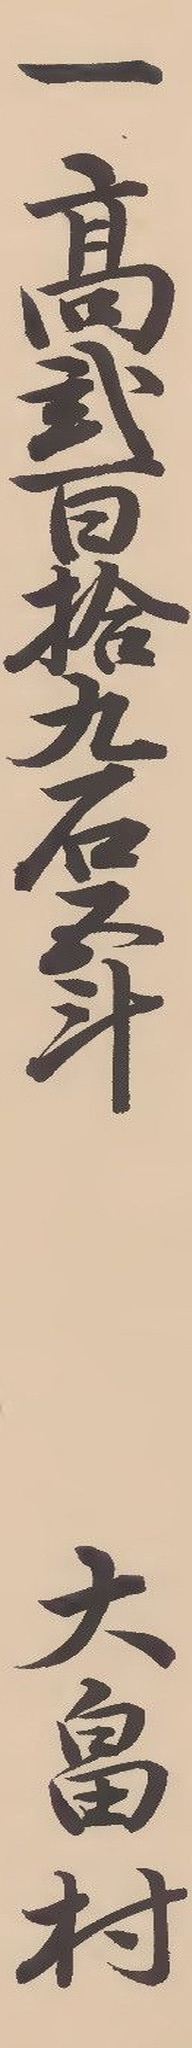一高弐百拾九石五斗大畠村
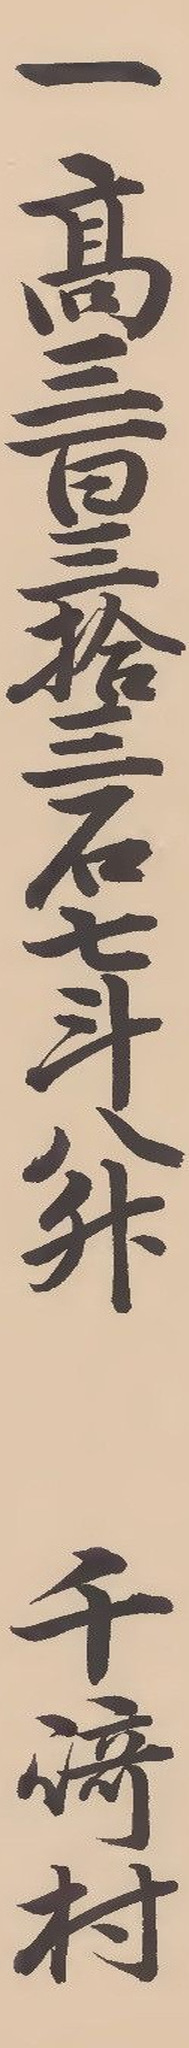一高三百三拾三石七斗八升千崎村
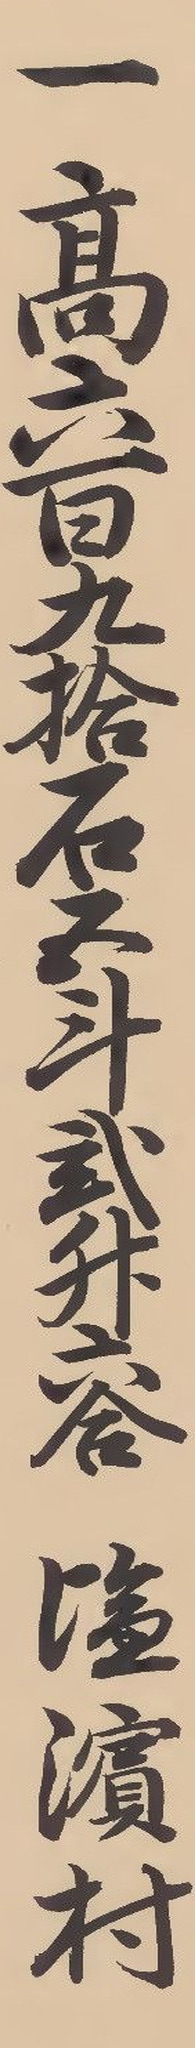一高六百九拾石五斗弐升六合塩浜村
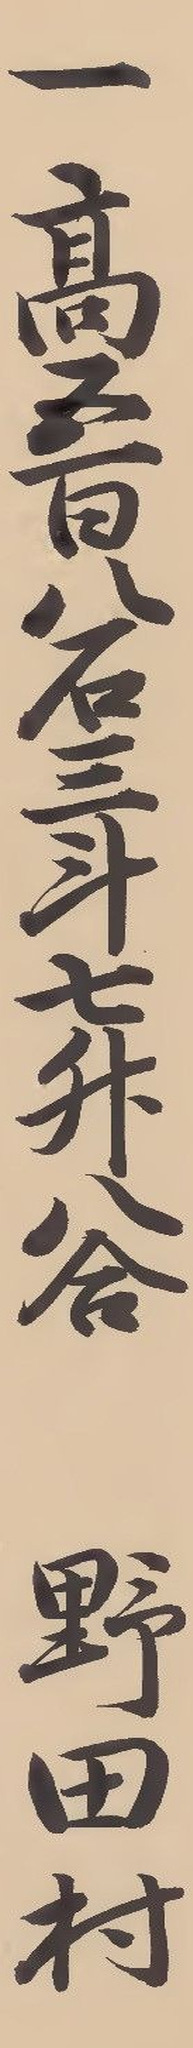一高五百八石三斗七升八合野田村
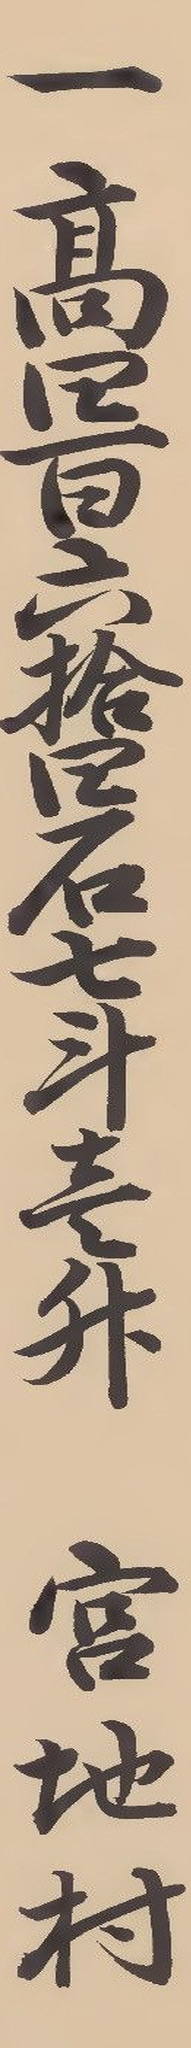一高四百六拾四石七斗壱升宮地村
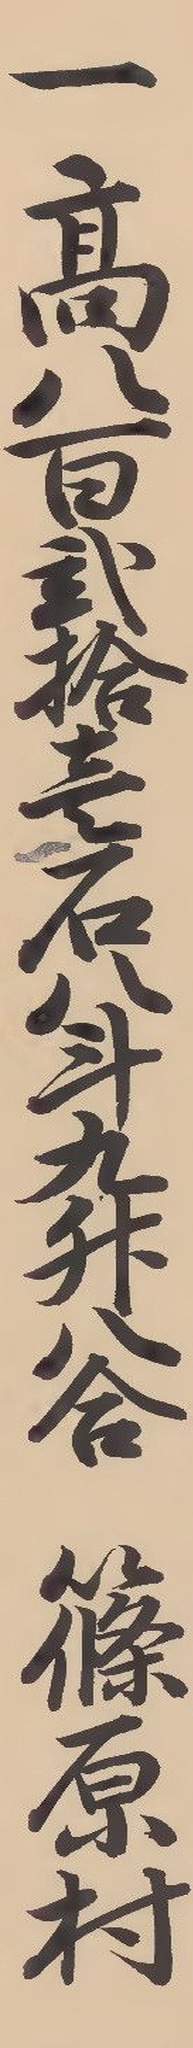一高八百弐拾壱石八斗九升八合篠原村

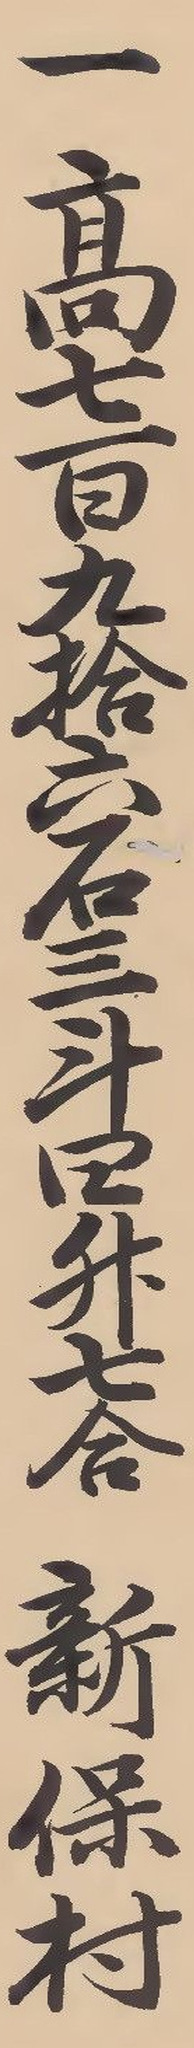一高七百九拾六石三斗四升七合新保村
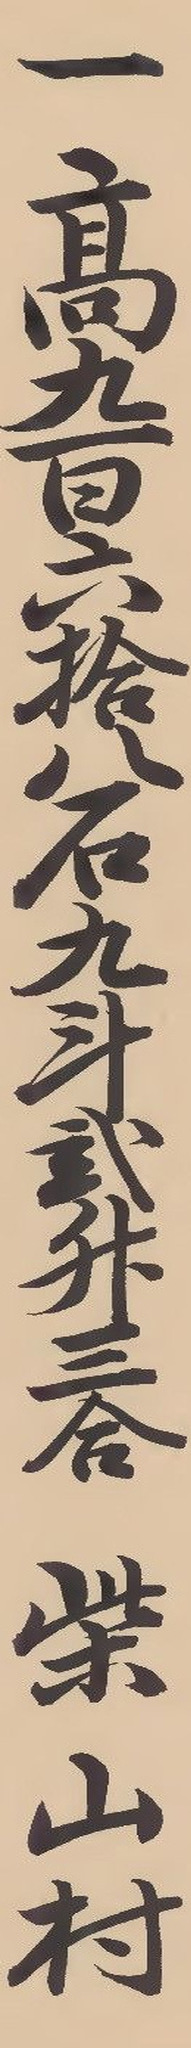一高九百六拾八石九斗弐升三合柴山村
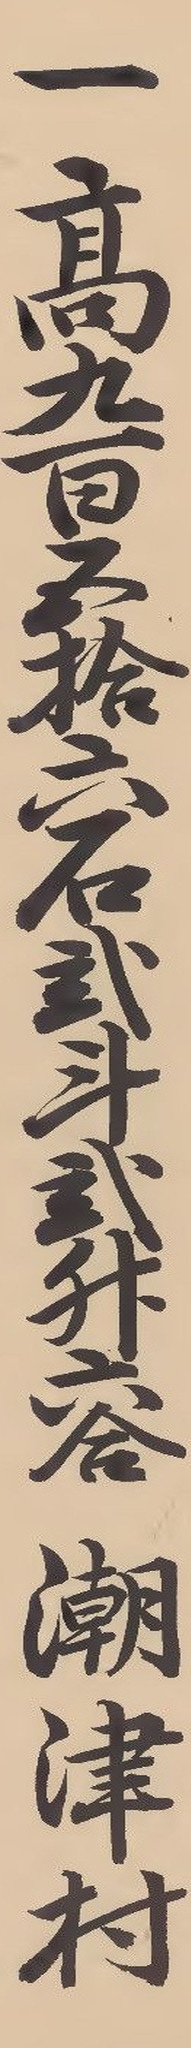一高九百五拾六石弐斗弐升六合潮津村
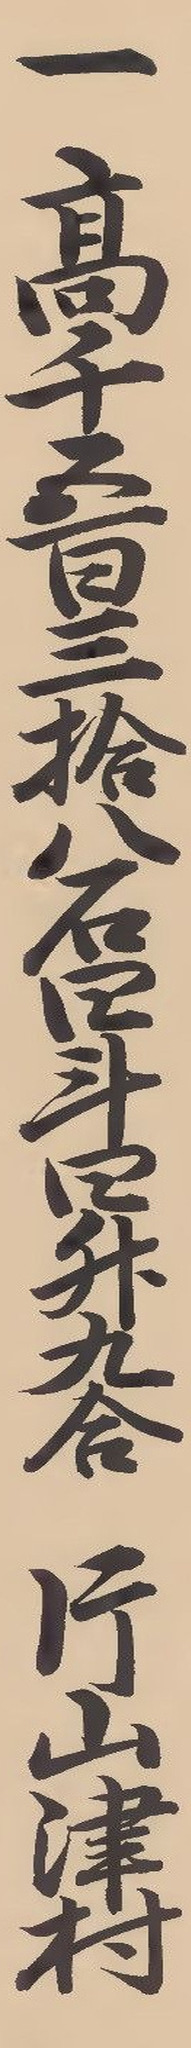一高千五百三拾八石四斗四升九合片山津村
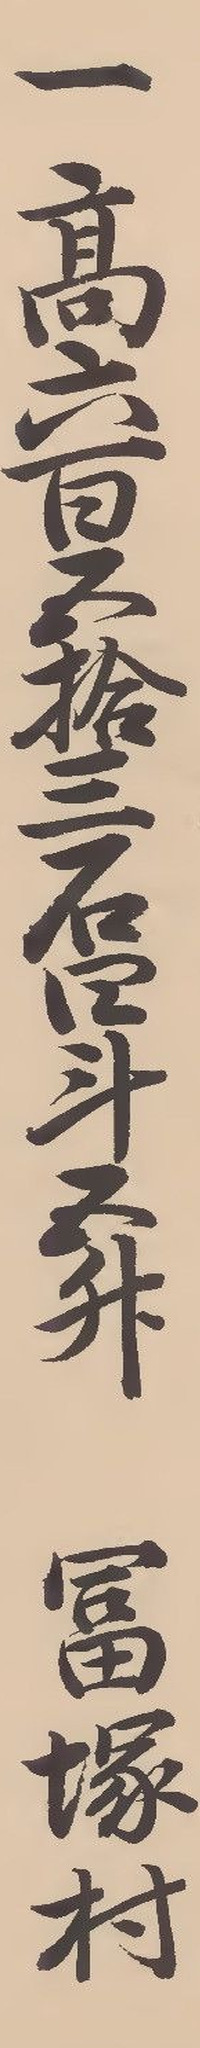一高六百五拾三石四斗五升富塚村
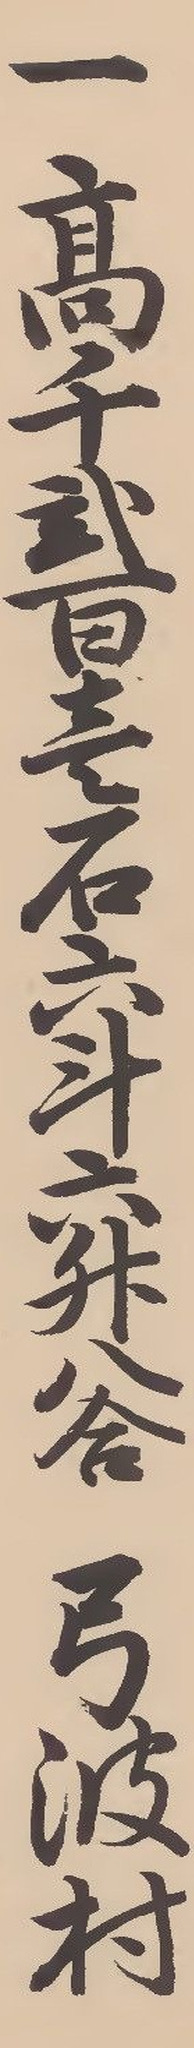一高千弐百壱石六斗六升八合弓波村
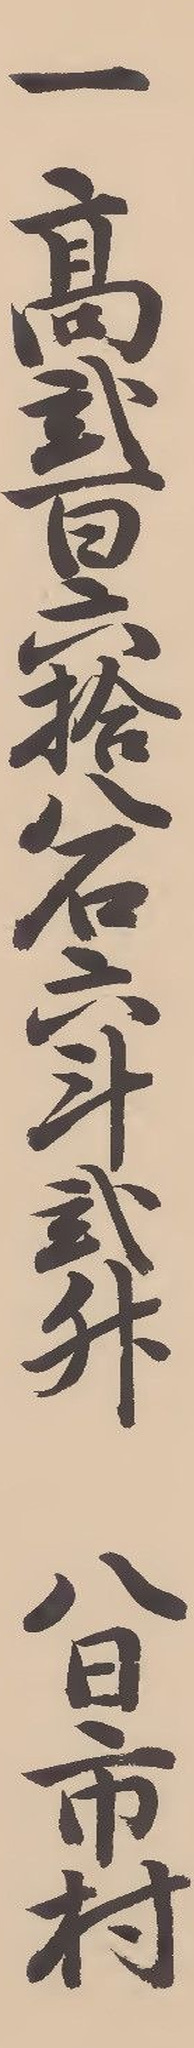一高弐百六拾八石六斗弐升八日市村
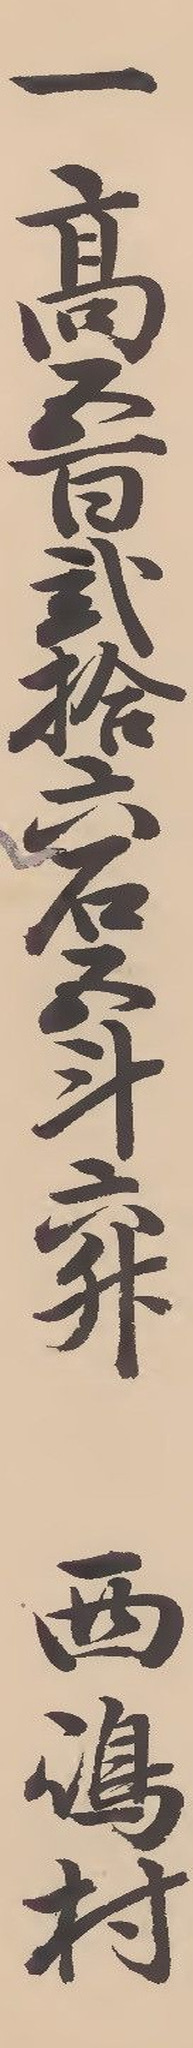一高五百弐拾六石五斗六升西島村

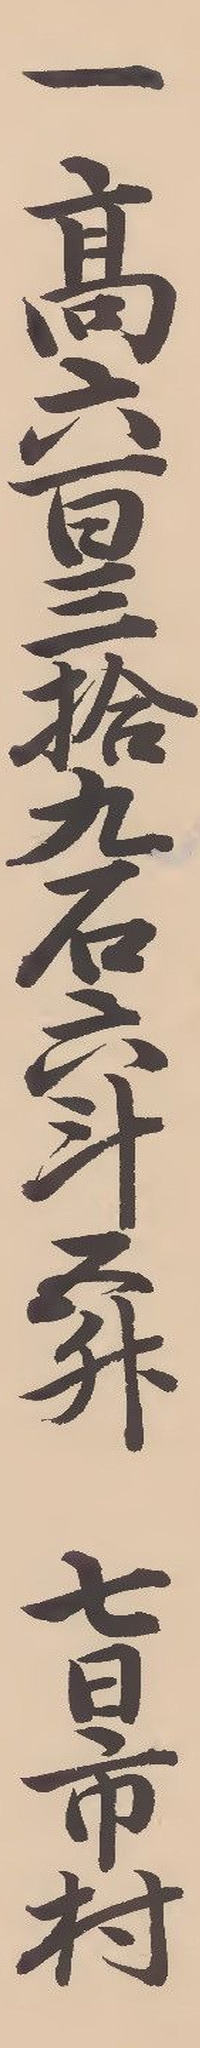一高六百三拾九石六斗五升七日市村
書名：加賀国郷帳
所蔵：国立公文書館 National Archives of Japan
